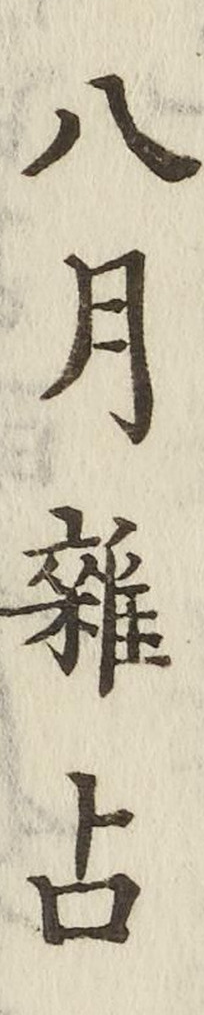八月雑占
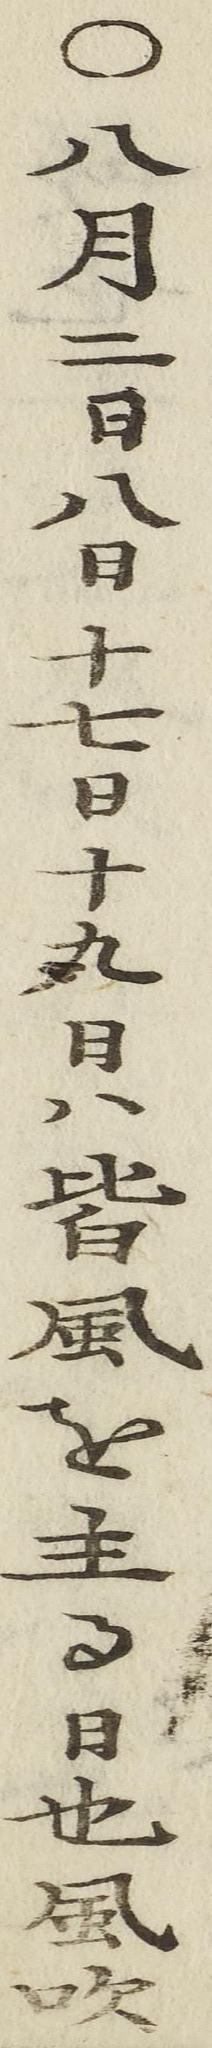○八月二日八日十七日十九日は皆風を主る日也風吹
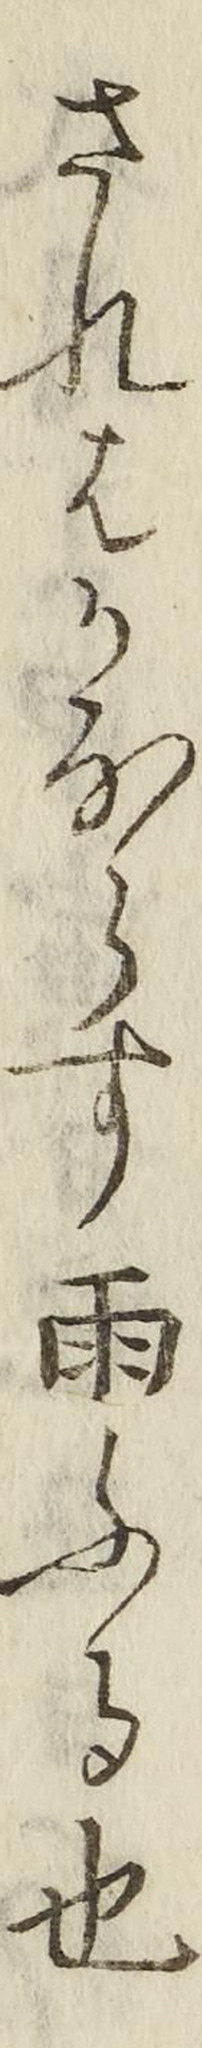されはかならす雨ふる也
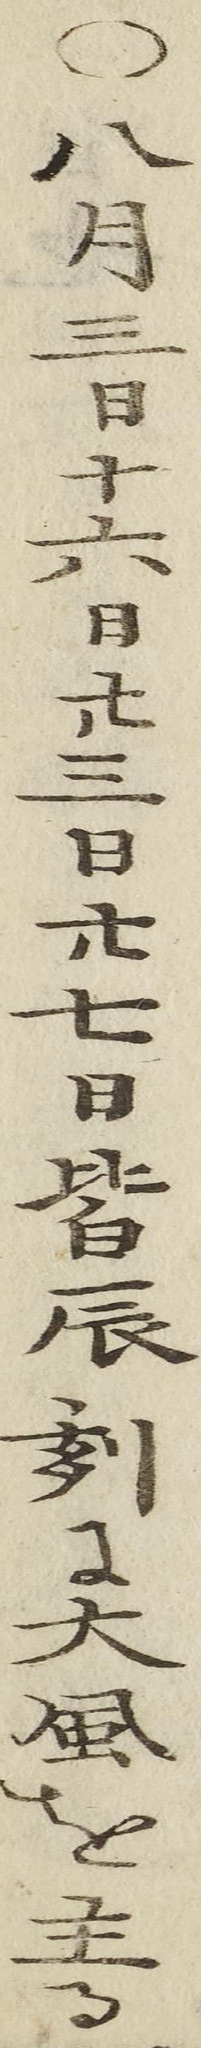○八月三日十六日廿三日廿七日皆辰刻に大風を主る

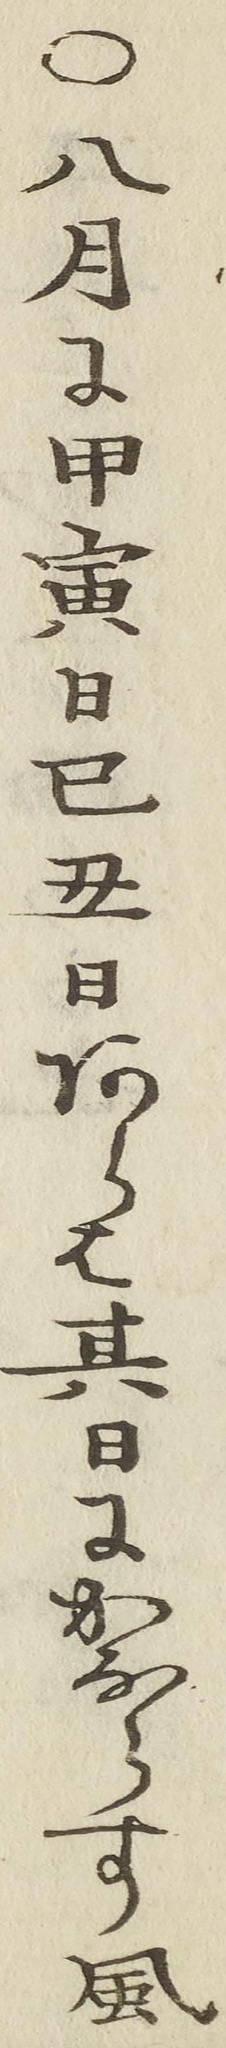○八月に甲寅日巳丑日あらは其日にかならす風
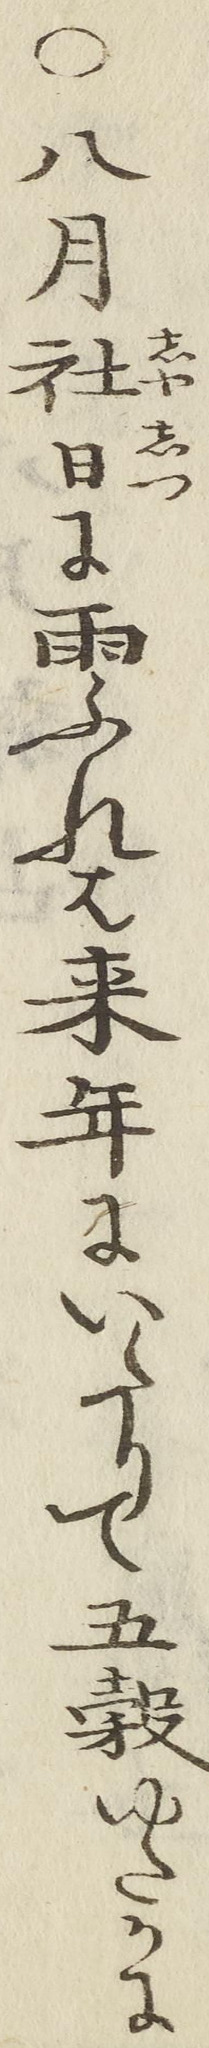○八月社日に雨ふれは来年にいたりて五穀ゆたかに
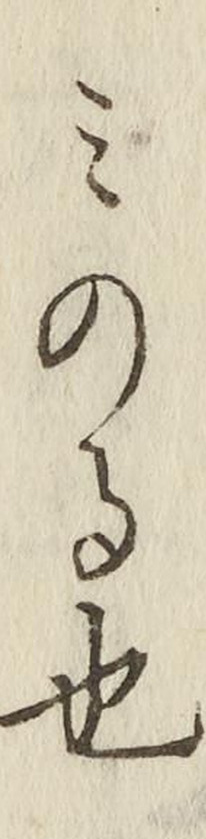みのる也
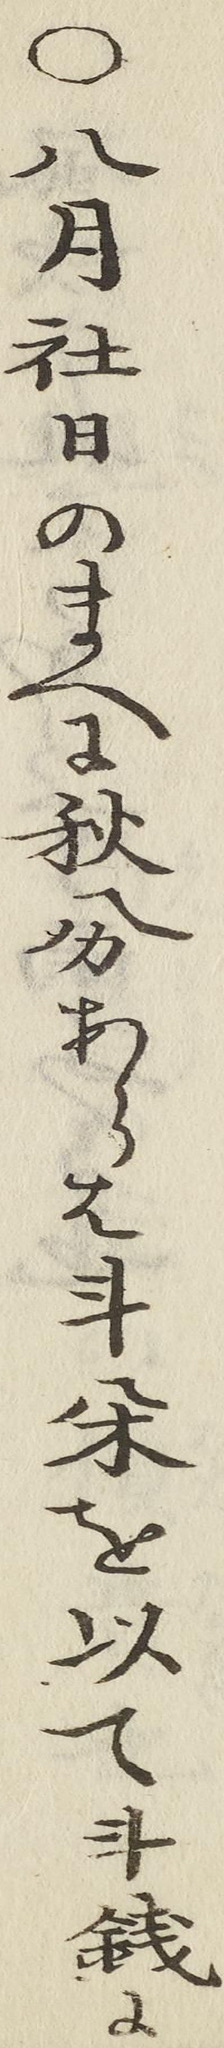○八月社日のまへに秋分あらは斗米を以て斗銭
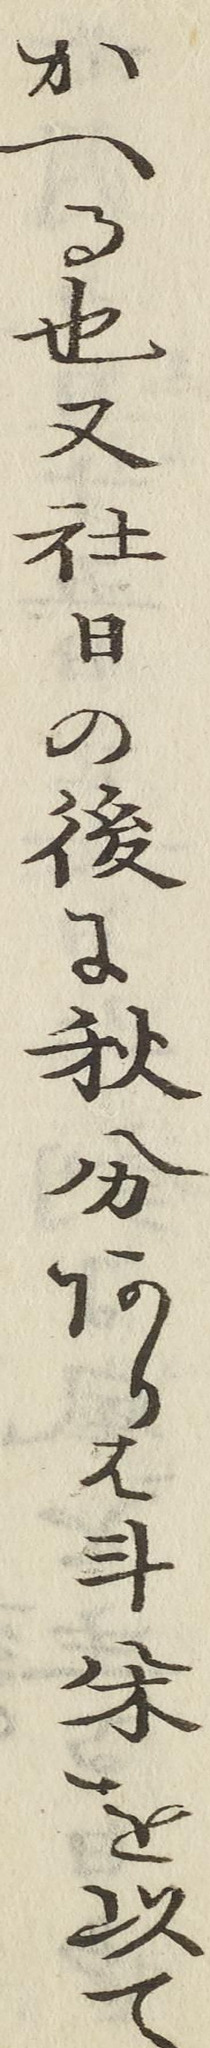かへる也又社日の後に秋分あらは斗米を以て
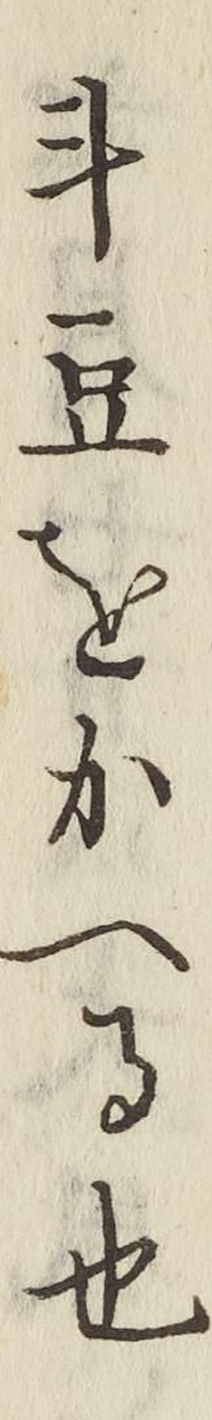斗豆をかへる也
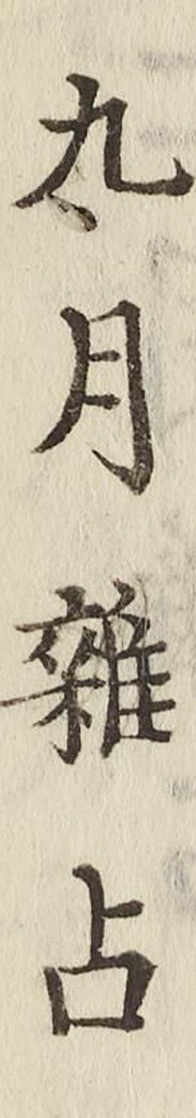九月雑占
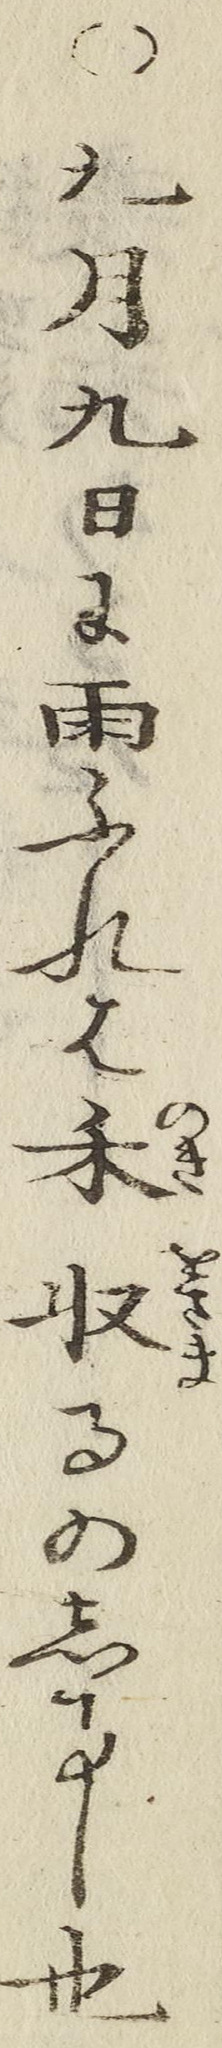○九月九日に雨ふれは禾収るのしるし也
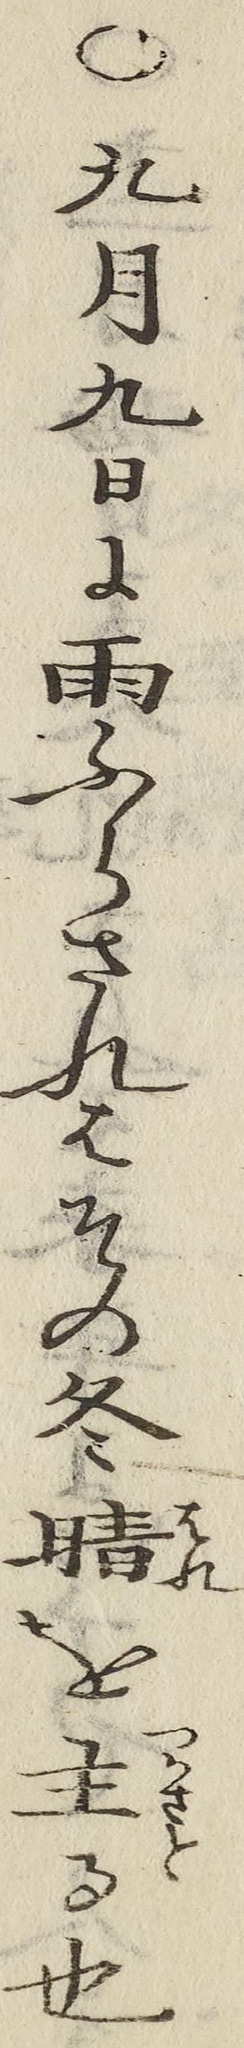○九月九日に雨ふらされはその冬晴を主る也
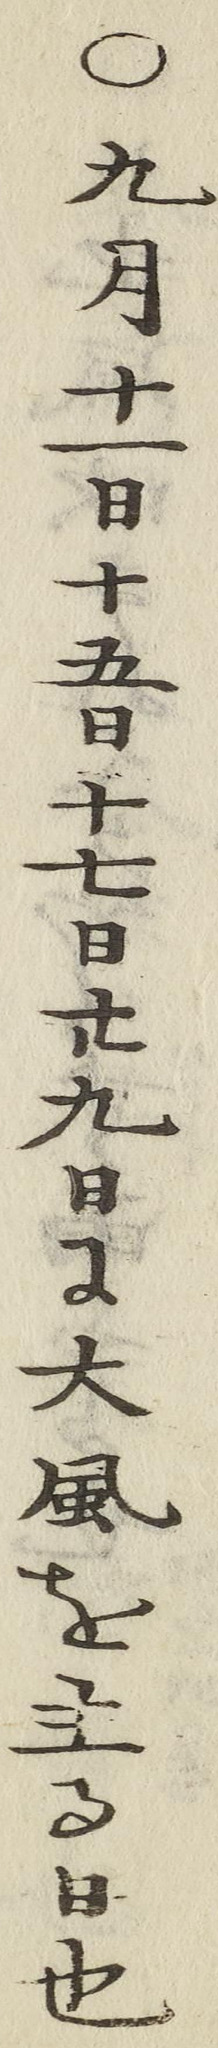○九月十一日十五日十七日廿九日に大風を主る日也
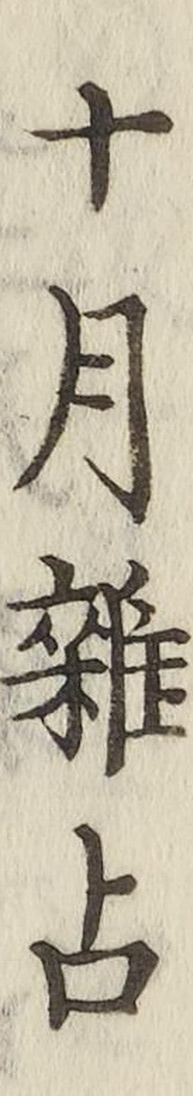十月雑占
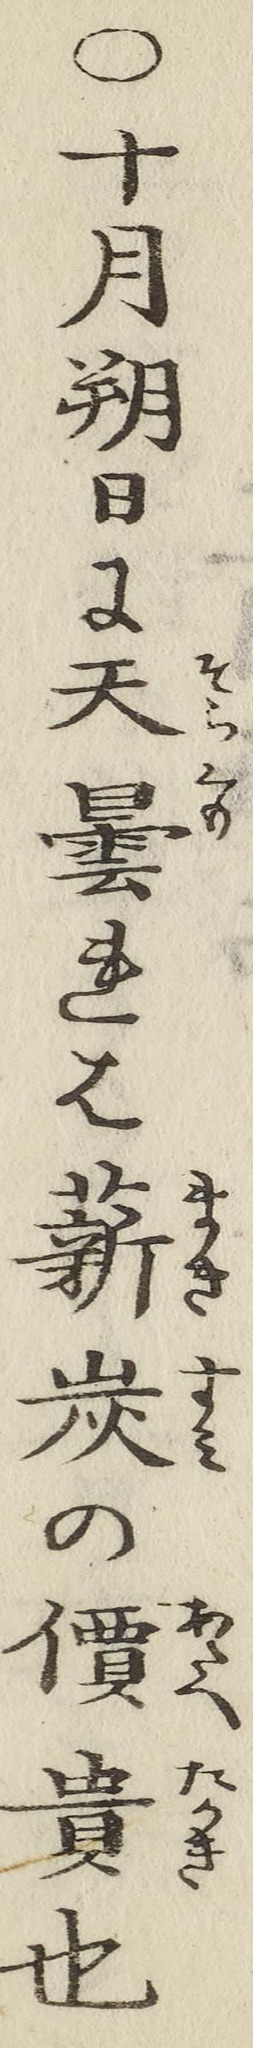○十月朔日に天曇れは薪炭の価貴也
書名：天時占候　二
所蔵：東京大学地震研究所図書室 Earthquake Research Institute Library, The University of Tokyo, JAPAN
